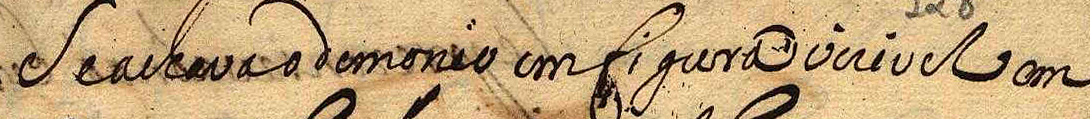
Se achava o demonio em figura vizivel em
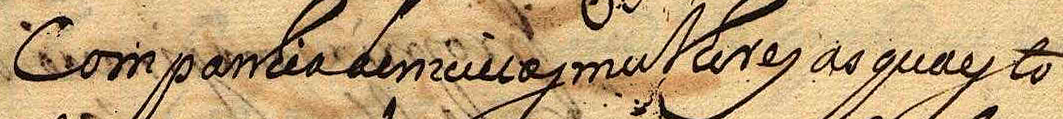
Companhia de muitas mulheres as quaes to
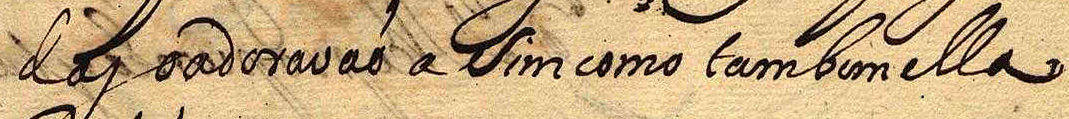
das o adoravaõ aSim como tambem ella
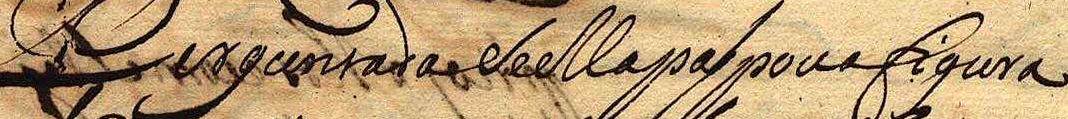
Perguntada Se ella palpou a figura
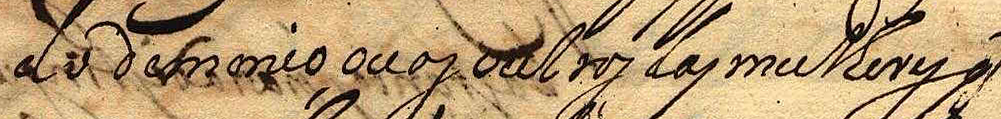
do demonio, ou as outras das mulheres q̄
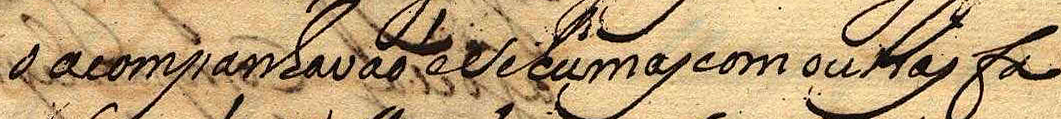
o acompanhavaõ, e se humas com outras fa
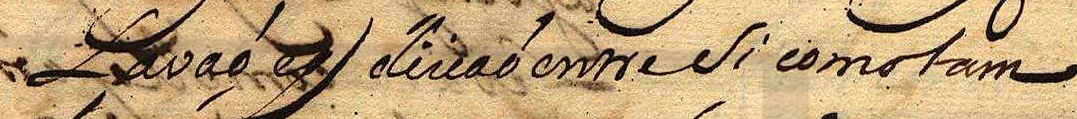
Lavaõ, e q̄ diziaõ, entre Si, como tam
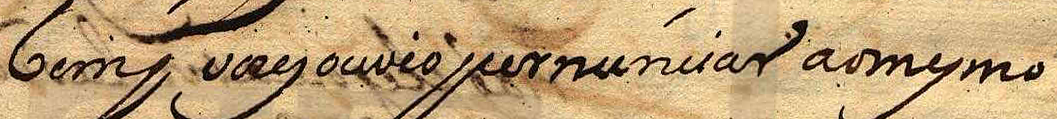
bem q̄ vozes ouvio pernunciar ao mesmo
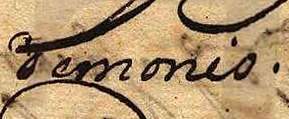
demonio?
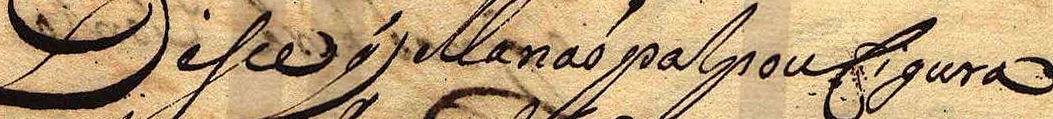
Disse q̄ ella naõ palpou figura
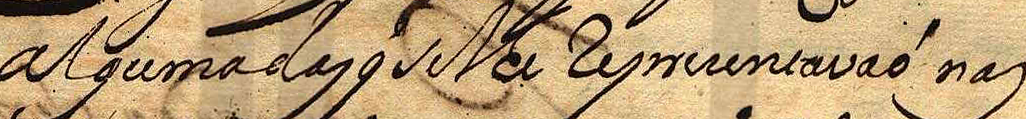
alguma das q̄ se lhe Reprezentavaõ nas
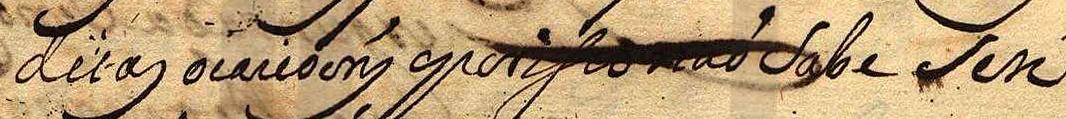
ditas ocazioens, e por isso naõ Sabe Se ti
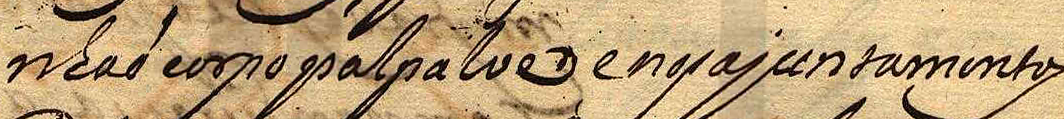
nhaõ corpo palpalve e nos ajuntamentos
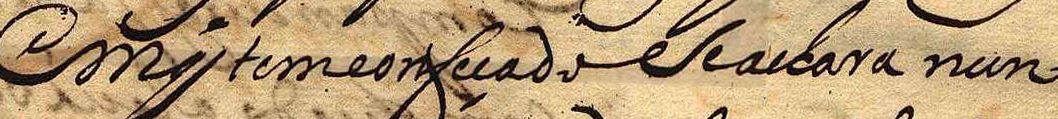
em q̄ tem confeçado Se achara nun
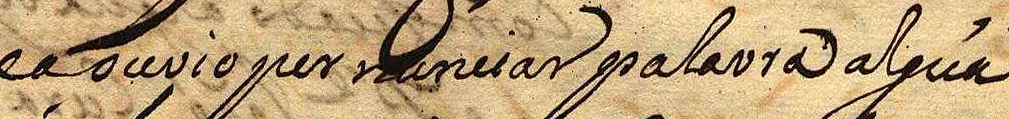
ca, ouvio pernunciar palavra algūa
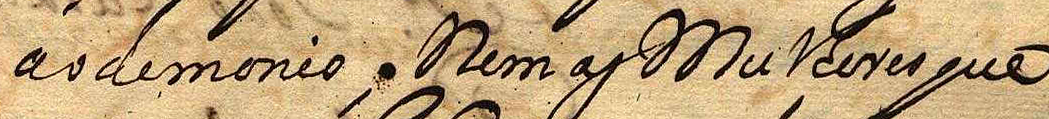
ao demonio, Nem as Mulheres que
